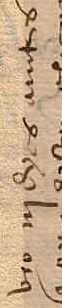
veo iij dyas amtes
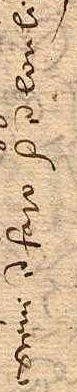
esteue ē faro e ē loule
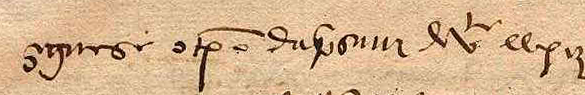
seguese o tp̄o da p̄sam de vte llopez
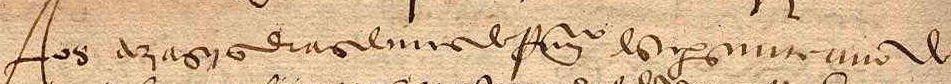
Aos dezasejs dias do mes de feuro deste ꝑsemte ano de
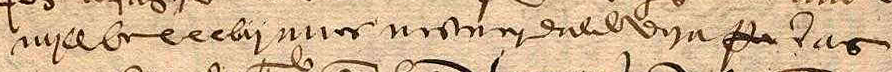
mjll bc xxxbij anos nesta cydade devora fo ē as
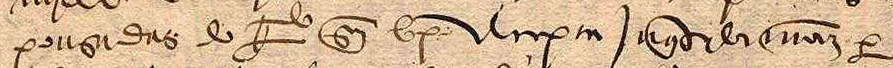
pousadas do Rdo s̄or bp̄o de cepta Jnq̄sydor moor ꝑ
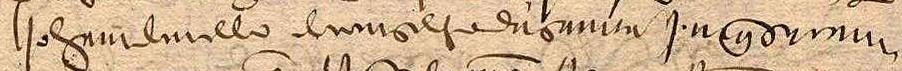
Joham de mello do comselho da samta Jmq̄syçam
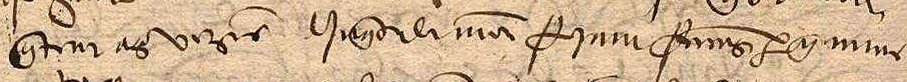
q̄ tem as vezes de Jnq̄sydor mor foram feitas ꝑḡmtas
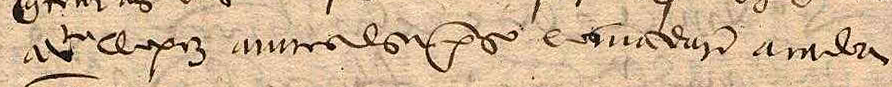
a vte llopez amtes de ser p̄so e o mādarē a cadea
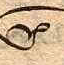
c̄ꝭ
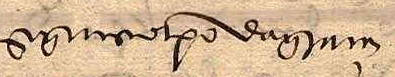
seguese o tp̄o da graça
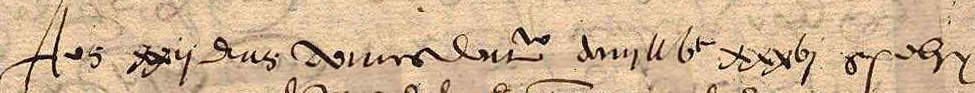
Aos xxij dias do mes doutro de mjll bc xxxbj se pobry
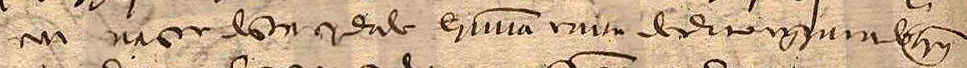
cou na see desta cydade hūua carta de edito e graça de trȳ
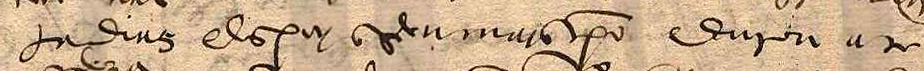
ta dias e despoys se deu mais tp̄o e durou ate
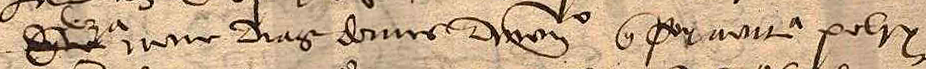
dezanoue dias do mes de nouro q̄ foy a outa pobry
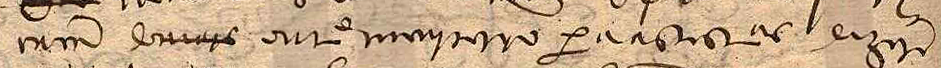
caçā do mais outo monjtoryo ꝑa as testas dizerē
